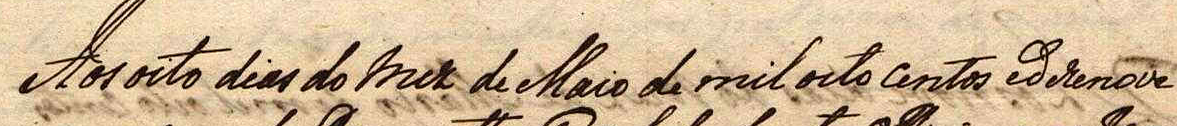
Aos oito dias do Mez de Maio de mil oitocentos e dezenove
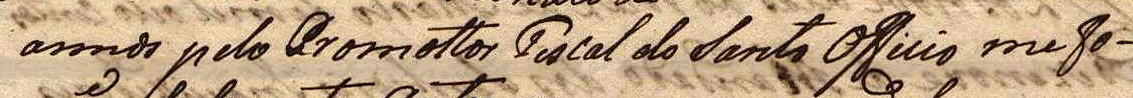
annos pelo Promottor Fiscal do Santo Officio me fo
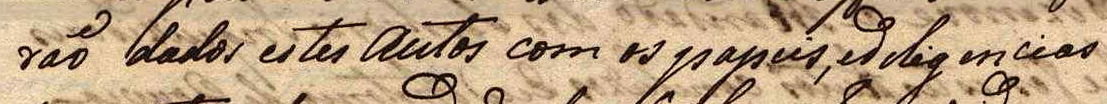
raõ dados estes autos com os papeis, e deligencias
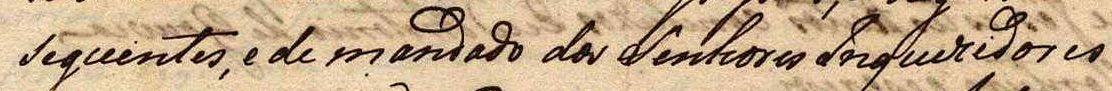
seguintes, e de mandado dos Senhores Inquizidores
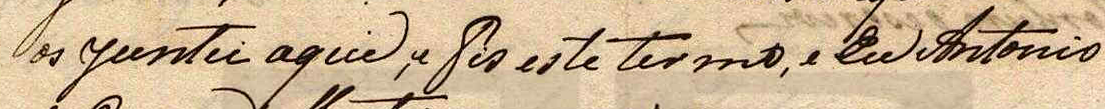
os juntei aqui, e fis este termo, e Eu Antonio
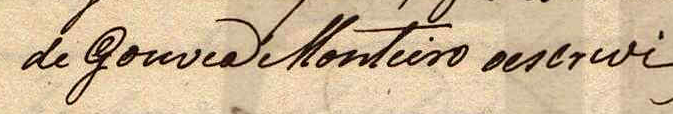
de Gouvea Monteiro o escrevi
